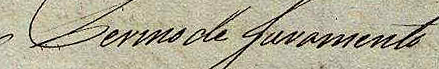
Termo de Juramento
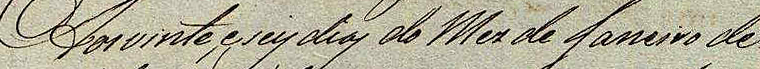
Aos vinte, e seis dias dos Mez de Janeiro de
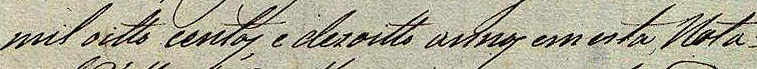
mil oitto centos, e dezoito annos em esta Nota
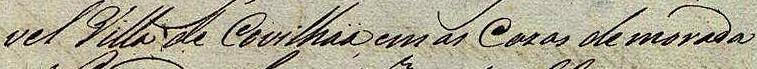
vel Villa de Covilhaa, em as Cazas de morada
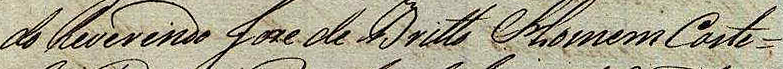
do Reverendo Joze de Brito Homem Caste
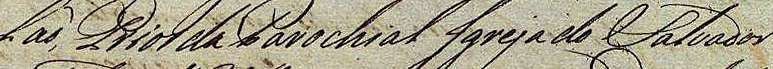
laõ, Prior da Parochial Jgreja do Salvador
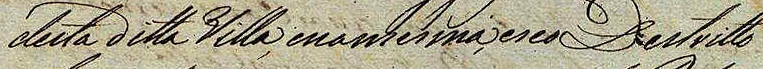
desta ditta Villa, e na mesma e seo Destritto
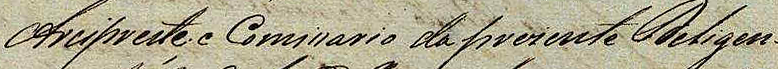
Arcipreste; e Comissario da prezente Deligen
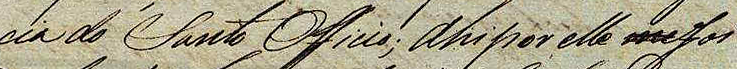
cia do Santo Officio; ahi por elle me foi
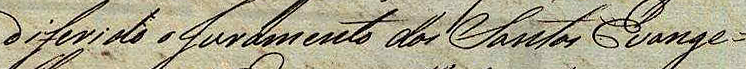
diferido o Juramento dos Santos Evange
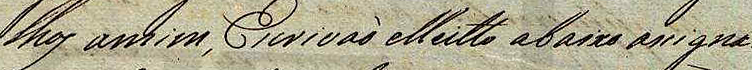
lhos a mim, Escrivaõ elleitto abaixo assigna
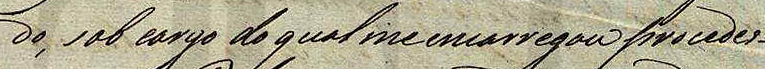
do, sob cargo do qual me encarregou procedes
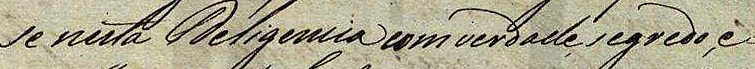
se nesta Deligencia com verdade, segredo, e
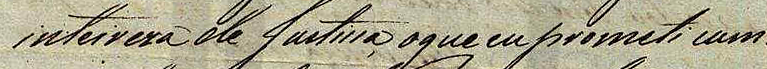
inteireza de Justiça, o que eu prometi cum
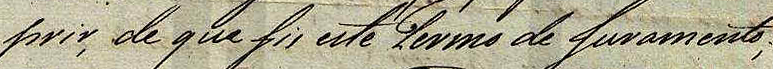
prir, de que fis este Termo de Juramento,
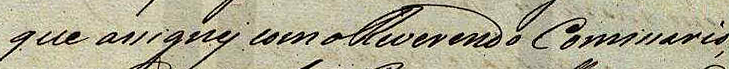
que assignej com o Reverendo Comissario,
